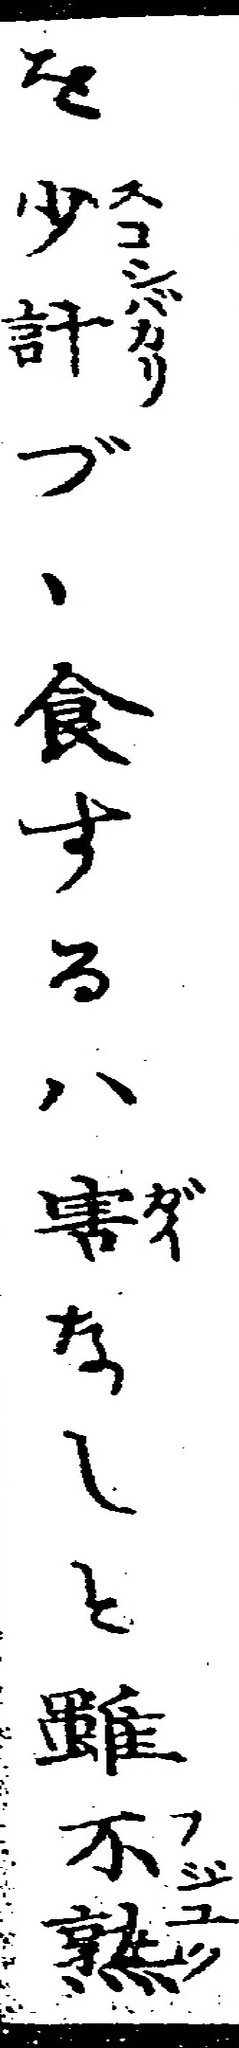を少計づゝ食するは害なしと雖不熟
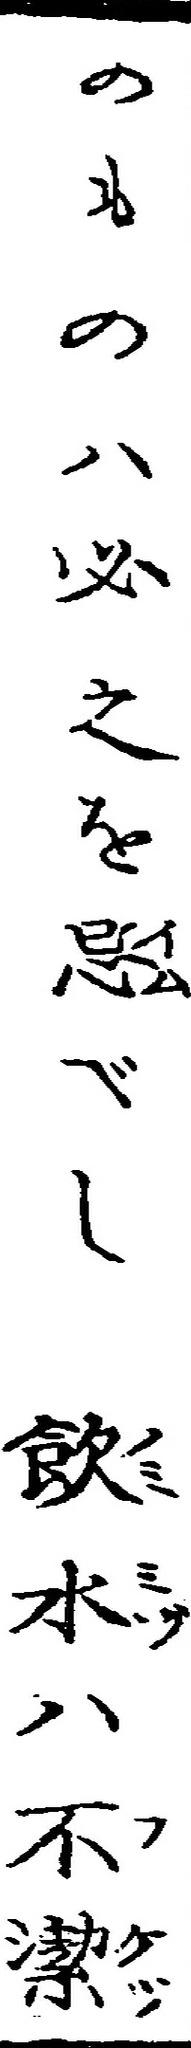のものは必之を忌べし飲水は不潔
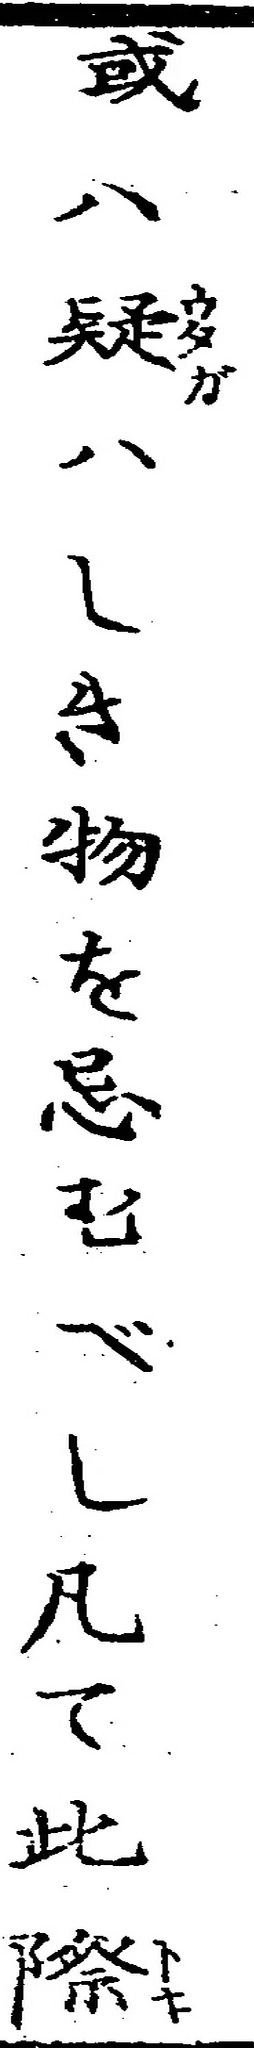或は疑はしき物を忌むべし凡て此際
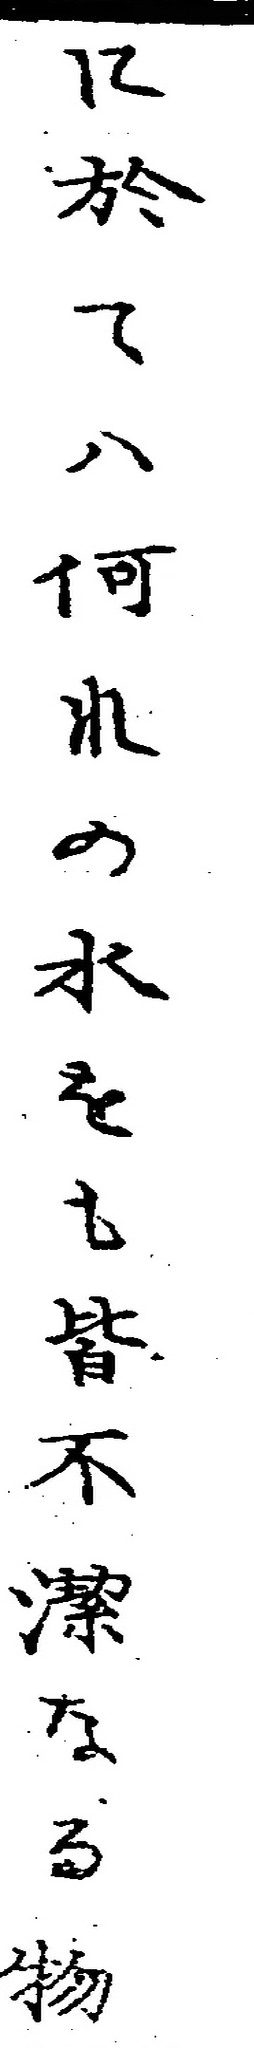に於ては何れの水をも皆不潔なる物
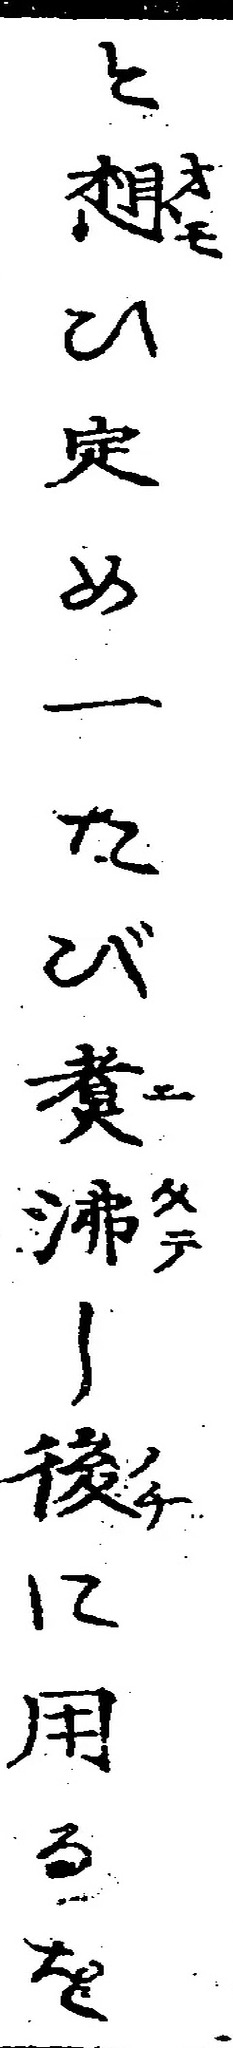と想ひ定め一たび煑沸し後に用るを
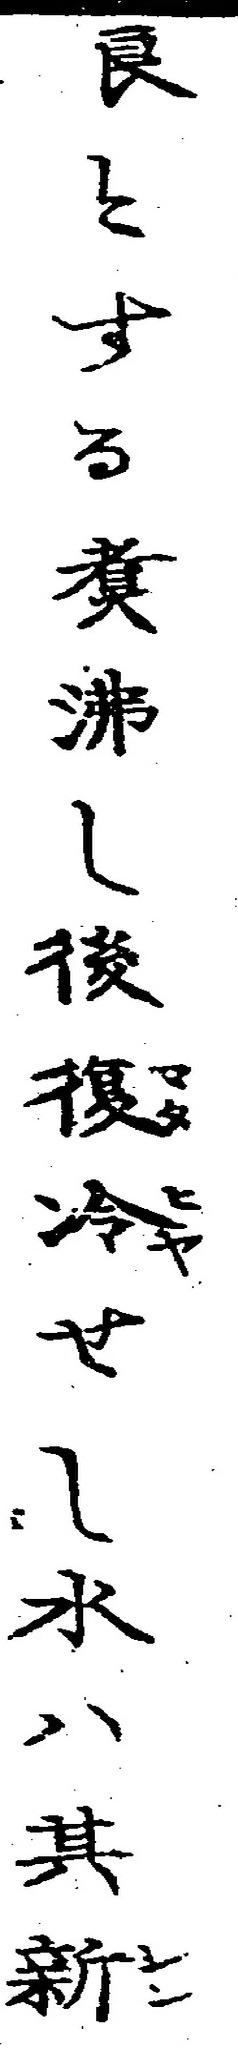良とする煑沸し後復冷せし水は其新
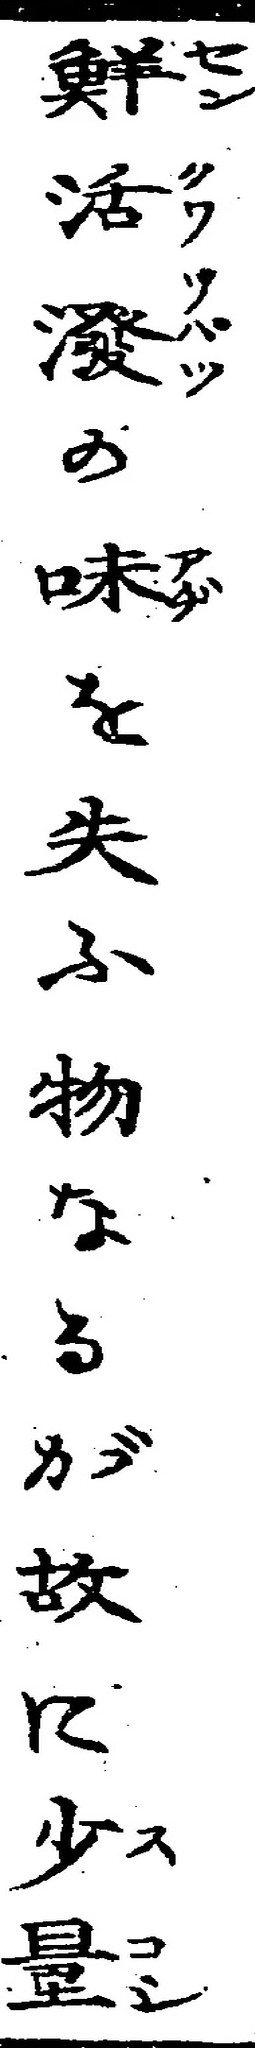鮮活潑の味を失ふ物なるが故に少量
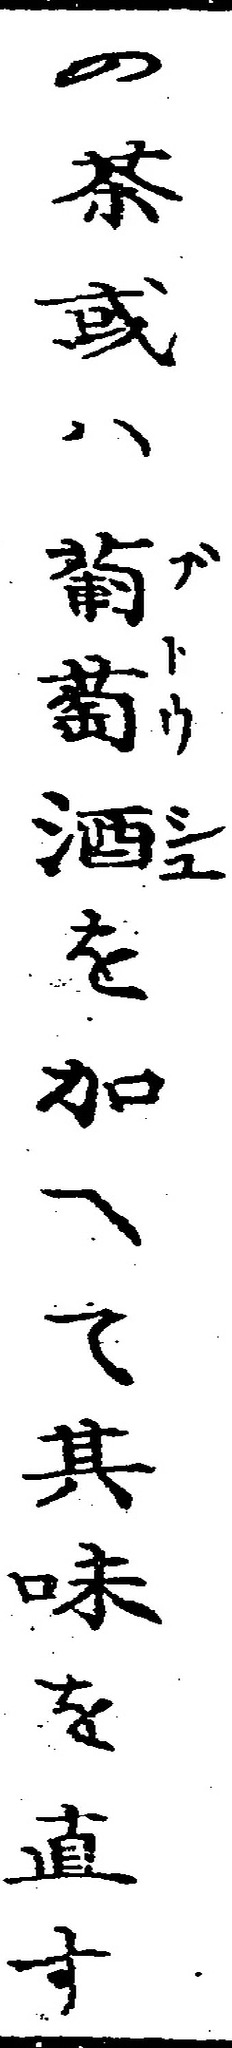の茶或は葡萄酒を加へて其味を直す
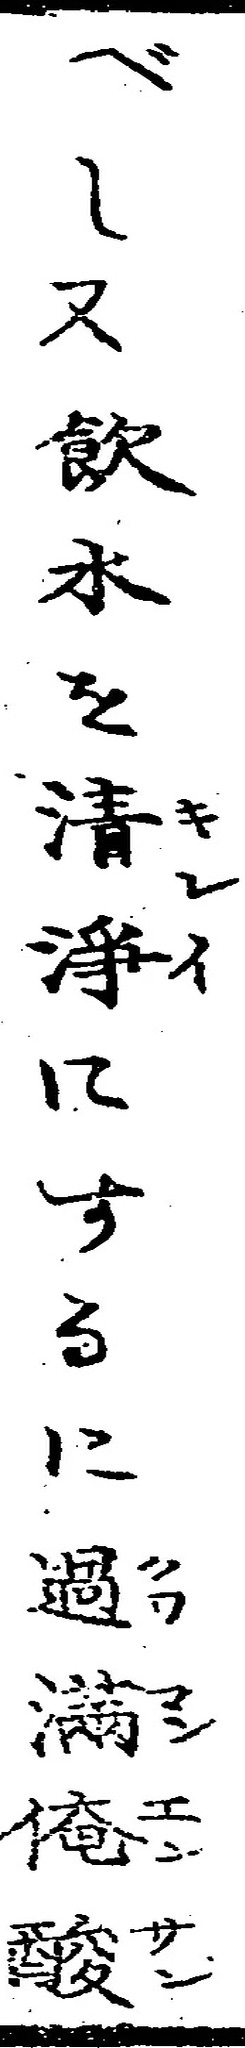べし又飲水を清浄にするに過満俺酸

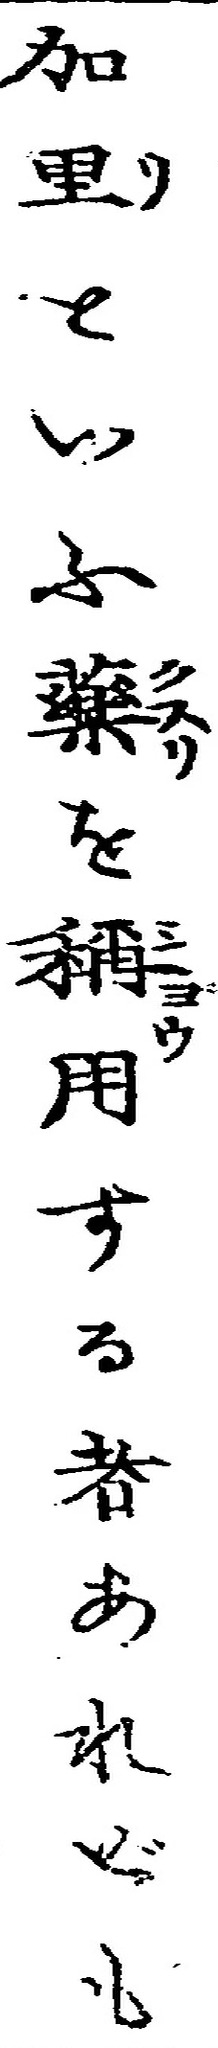加里といふ藥を稱用しする者あれども
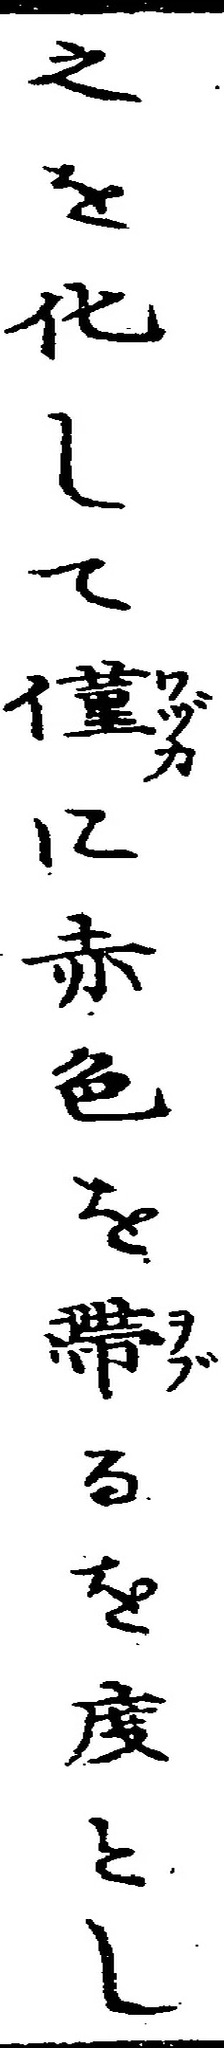之を化して僅に赤色を帶るを度とし
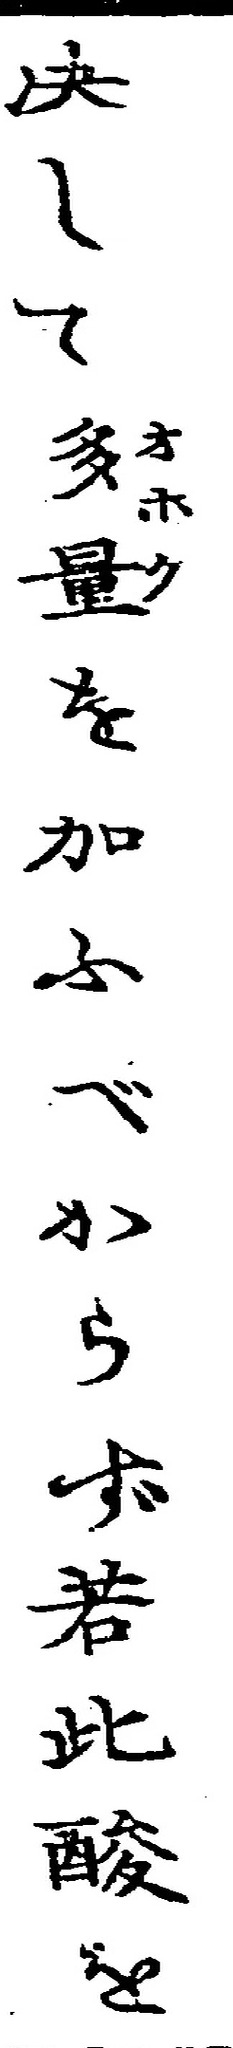決して多量を加ふべからず若此酸を
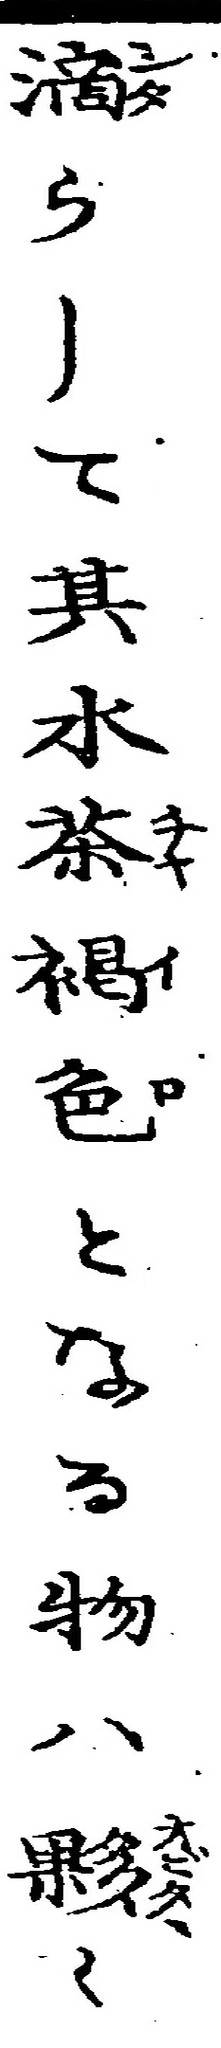滴らして其水茶褐色となる物は夥し
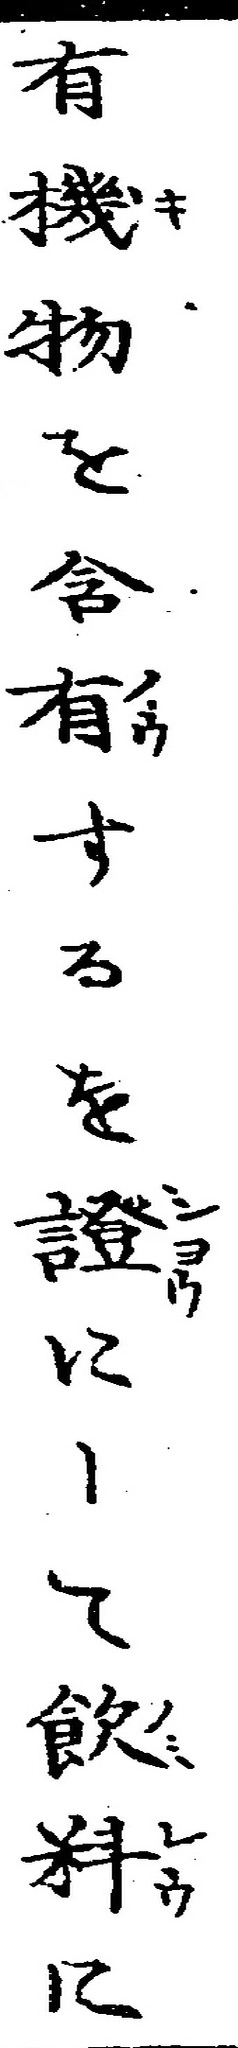有機物を含有するを證にして飲料に
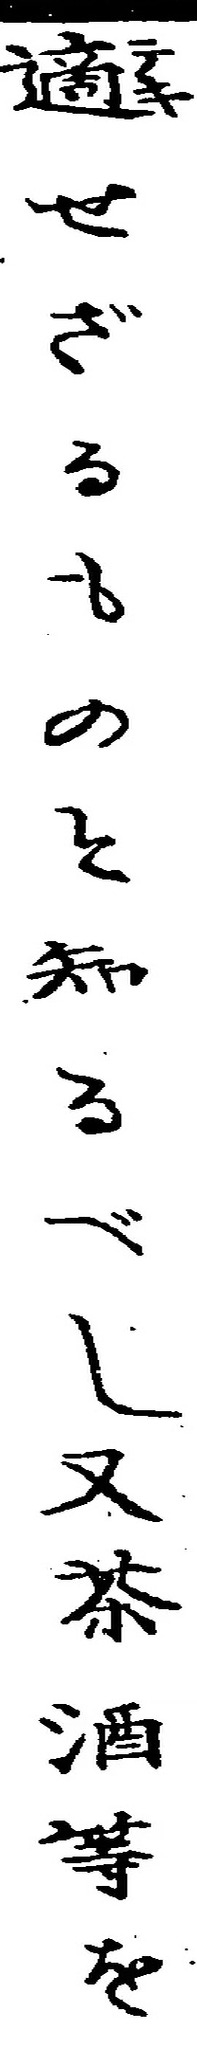適せざるものと知るべし又茶酒等を
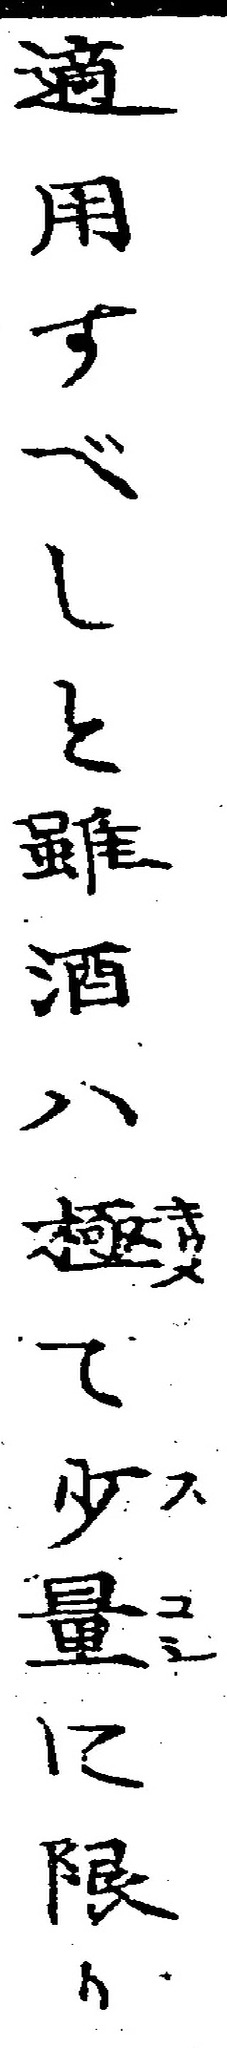適用すべしと雖酒は極て少量に限り
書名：虎列剌病予防用法
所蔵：国立国会図書館 National Diet Library, JAPAN
